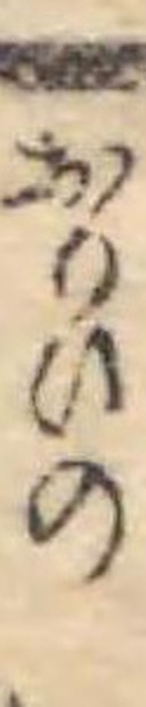おもひの
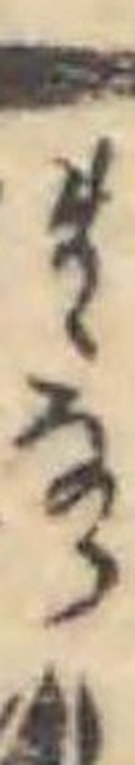まゝなら
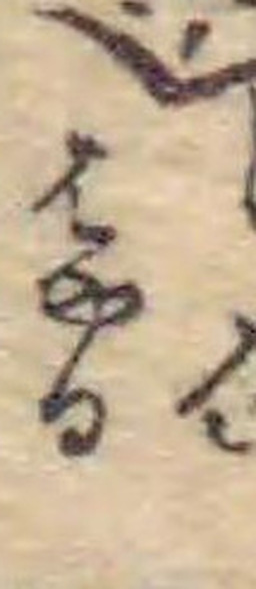はやる
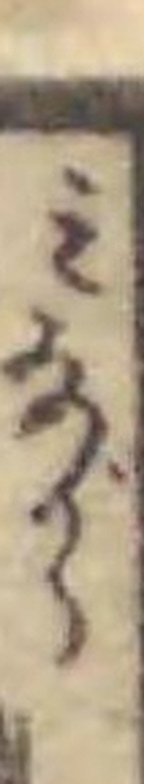みながら
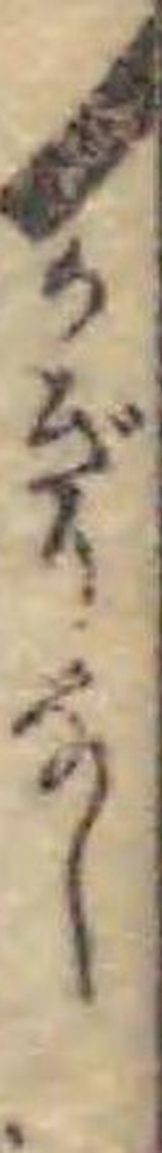かぎりなし
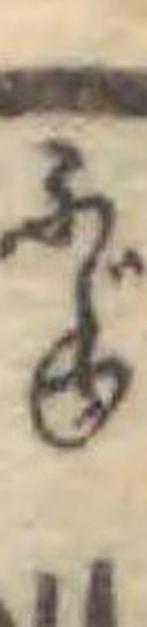ふじゆ
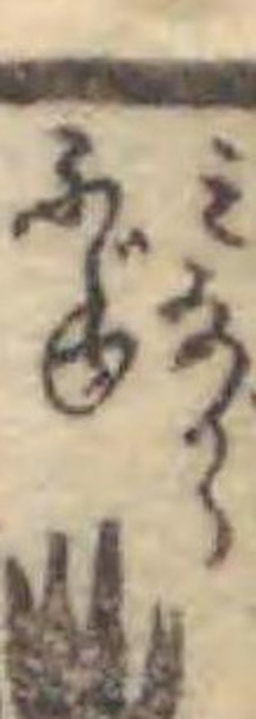ふじゆ
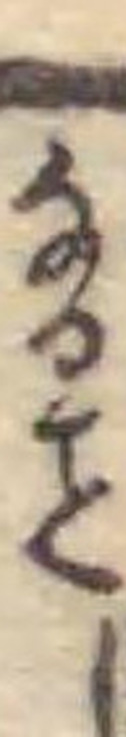なること
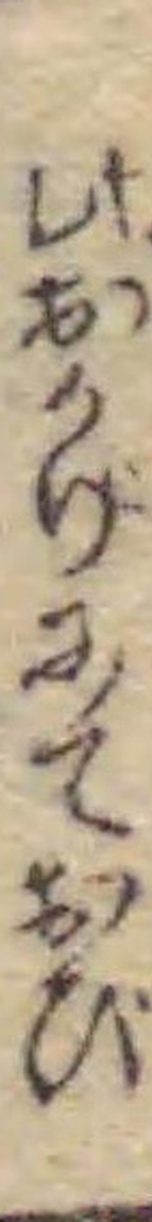此おかげにておび
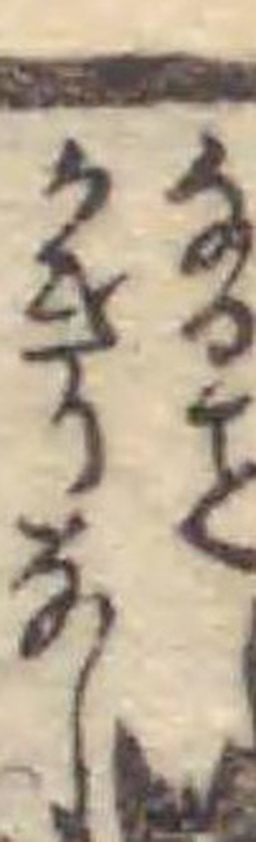かきりなし
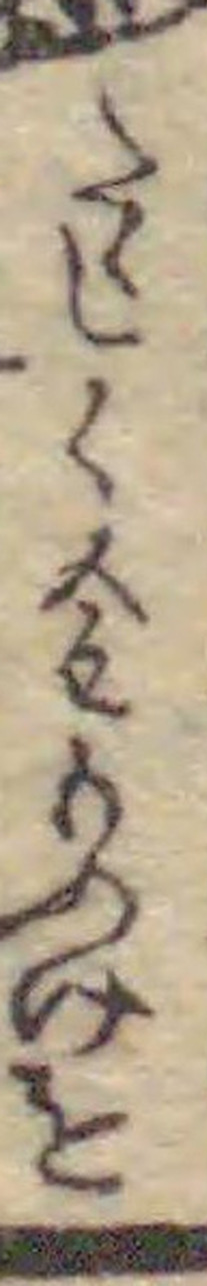たゝしく金もふけを
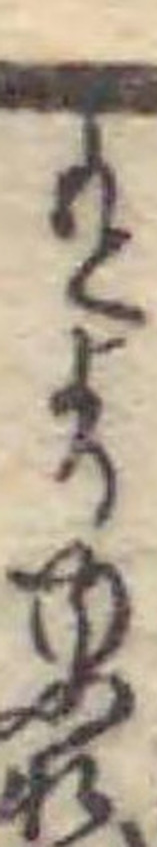もとよりゆふれい
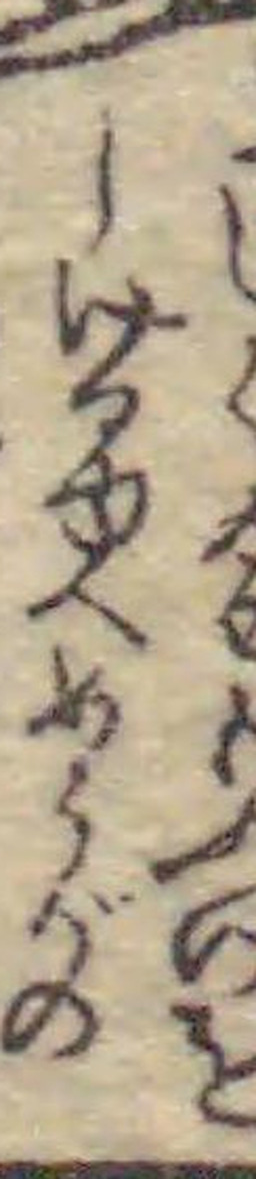しけるゆへめうがの
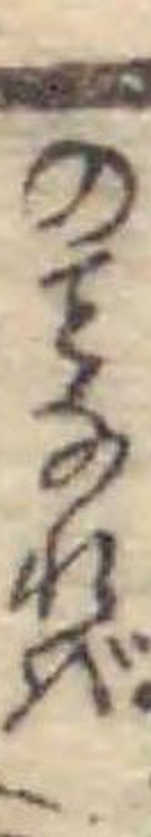のことなれば
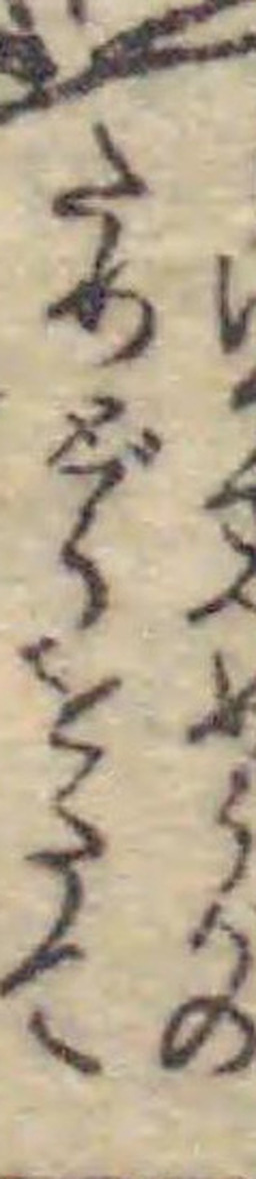ためどうをたて
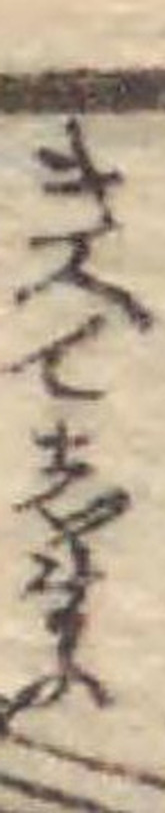きへてしまふ
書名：鐘入七人化粧 : 3巻
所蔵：国立国会図書館 National Diet Library, JAPAN
